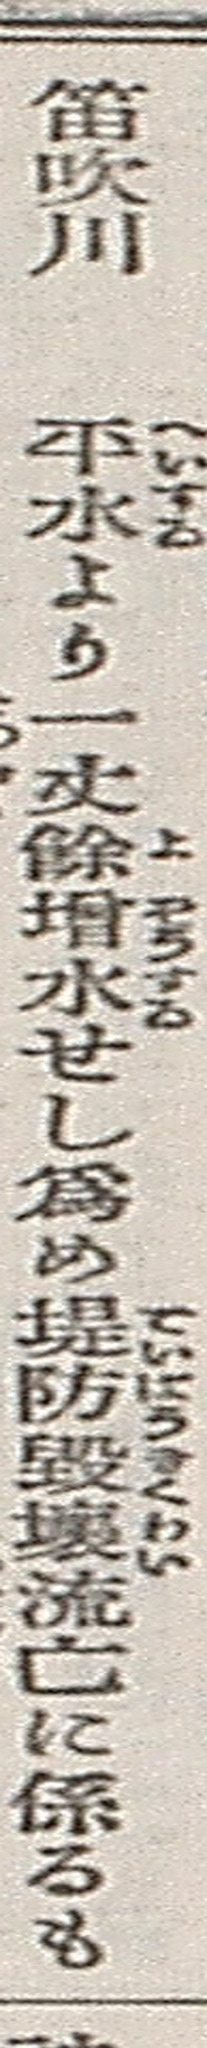笛吹川平水より一丈餘増水せし為め堤防毀壊流亡に係るも
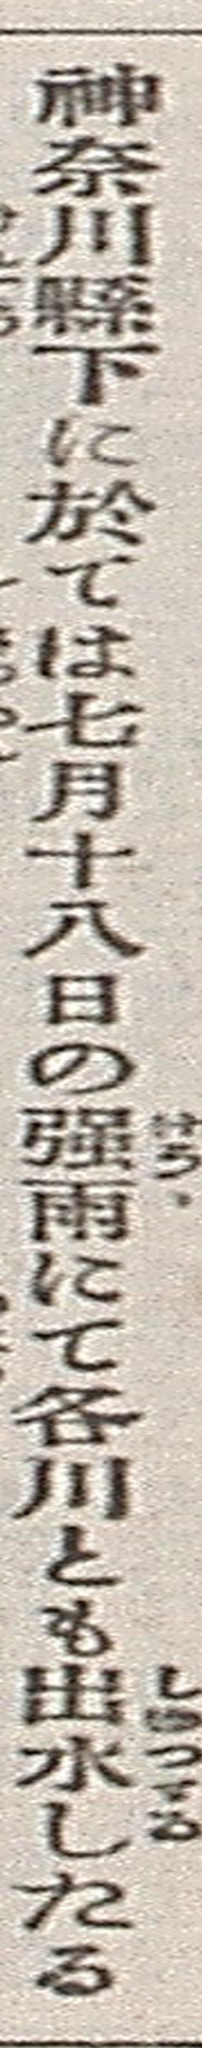神奈川県下に於ては七月十八日の強雨にて各川とも出水したる
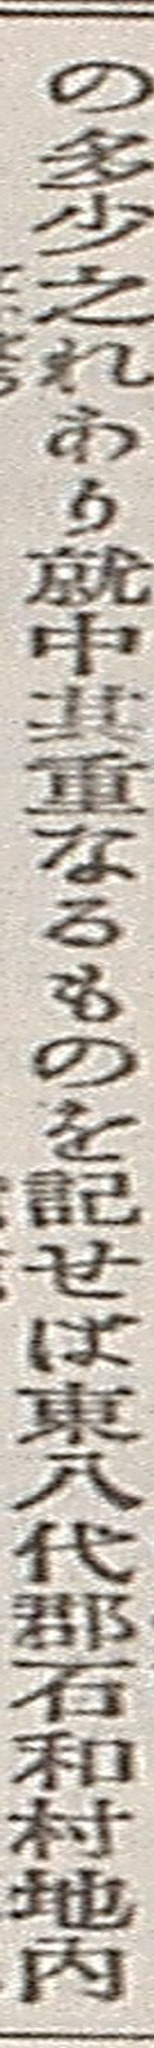の多少之れあり就中其重なるものを記せば東八代郡石和村地内
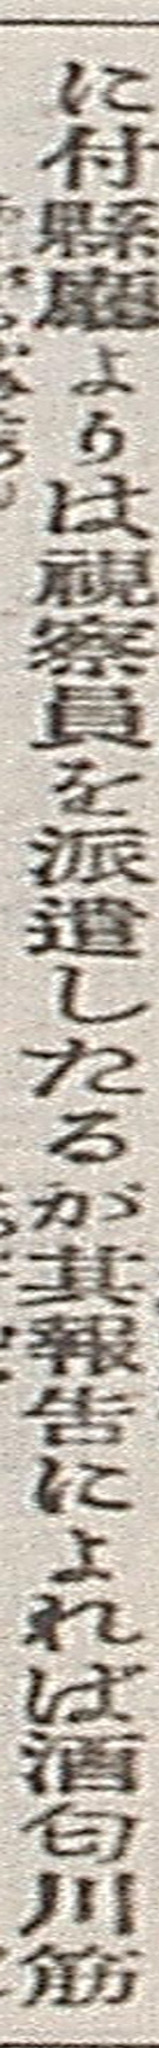に付県庁よりは視察員を派遣したるが其報告によれば酒匂川筋
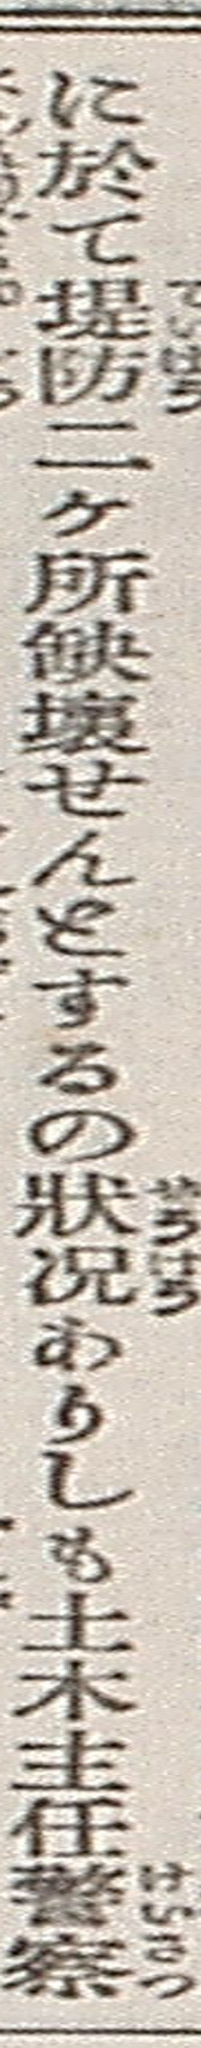に於て堤防二ヶ所缺壊せんとするの状況ありしも土木主任警察
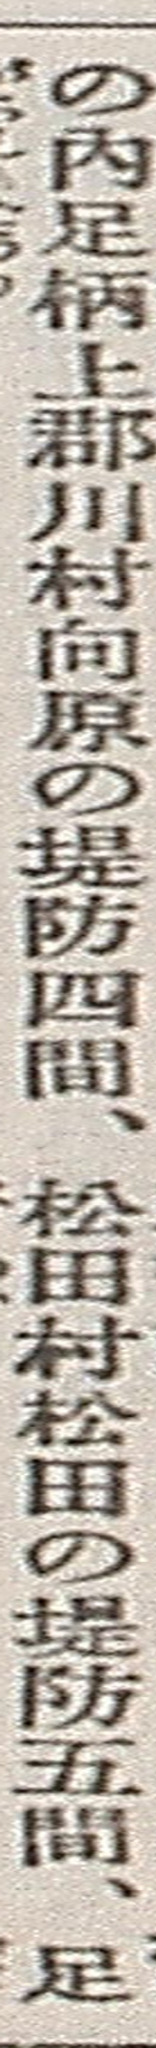の内足柄上郡川村向原の堤防四間、松田村松田の堤防五間、足
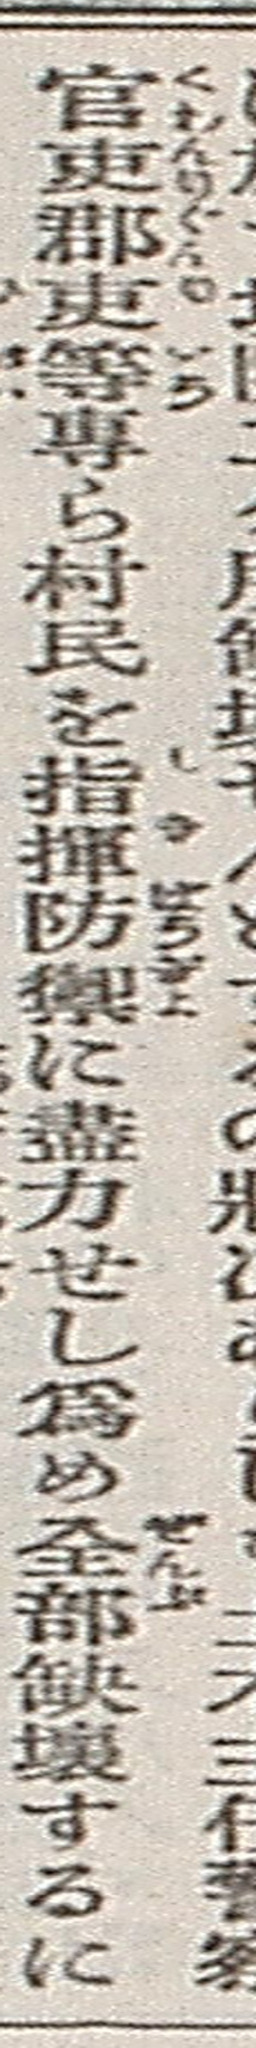官吏郡吏等専ら村民を指揮防禦に尽力せし為め全部缺壊するに
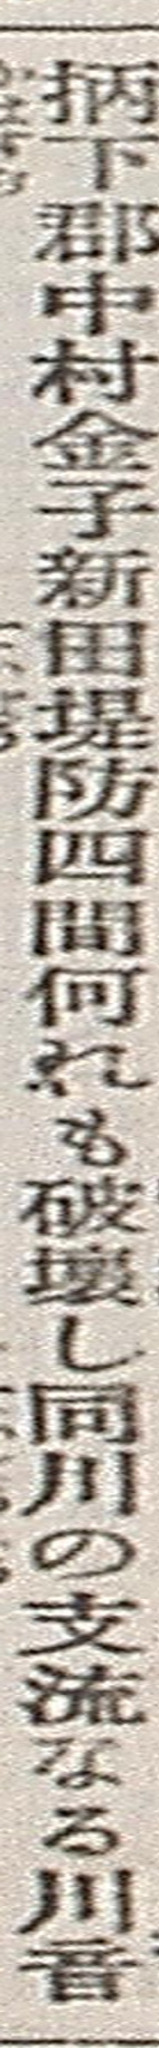柄下郡中村金子新田堤防四間何れも破壊し同川の支流なる川音
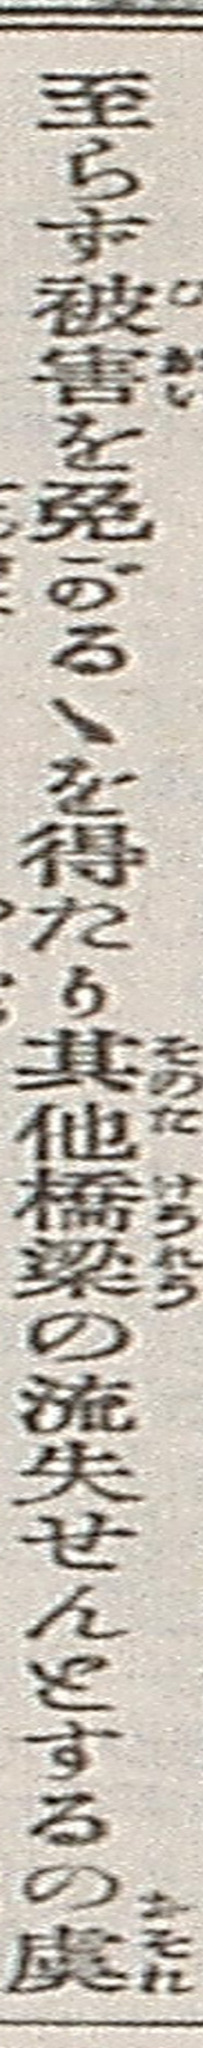至らず被害を免れるゝを得たり其他橋梁の流失せんとするの虞
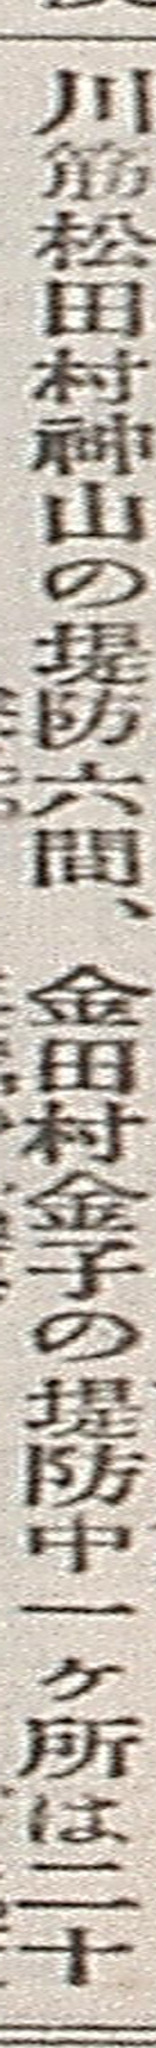川筋松田村神山の堤防六間、金田村金子の堤防中一ヶ所は二十
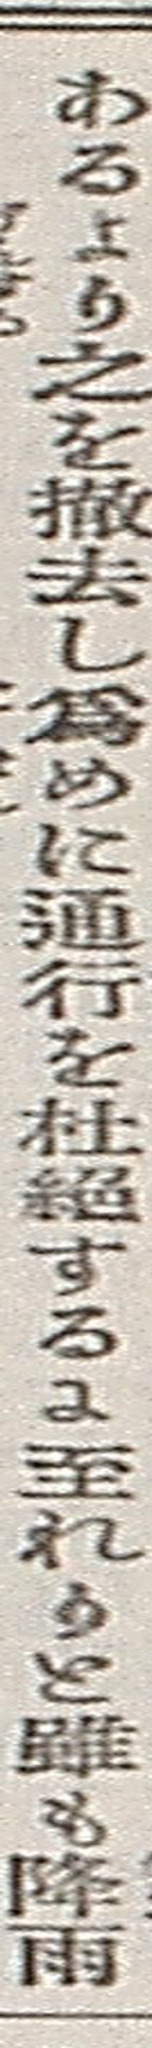あるより之を徹去し為めに通行を杜絶するに至れりと雖も降雨
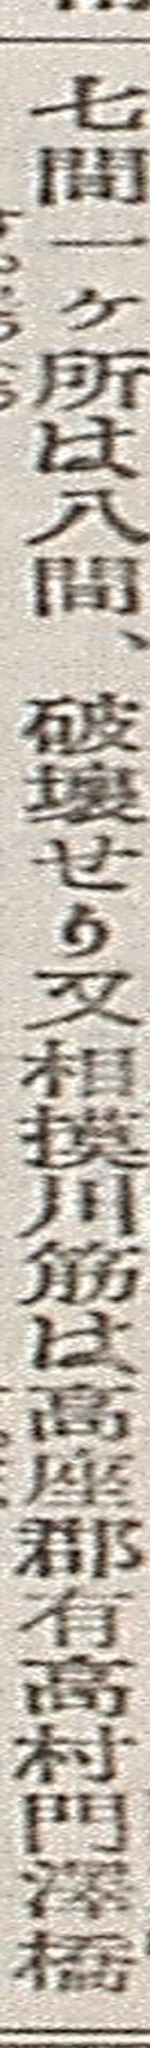七間一ヶ所は八間、破壊せり又相模川筋は高座郡有高村門沢橋
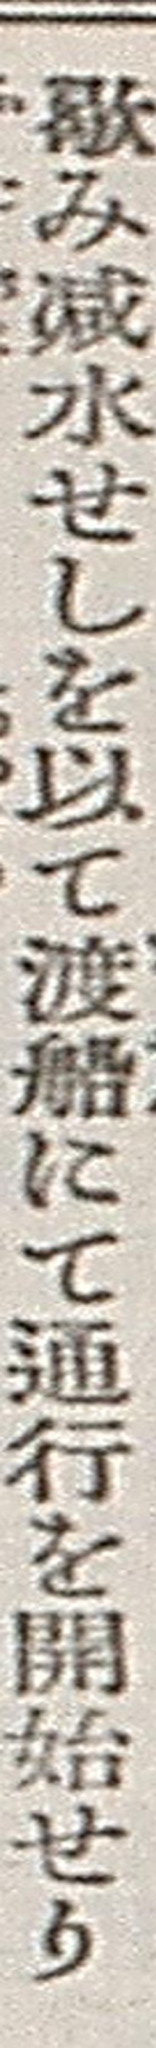缺み減水せしを以て渡船にて通行を開始せり
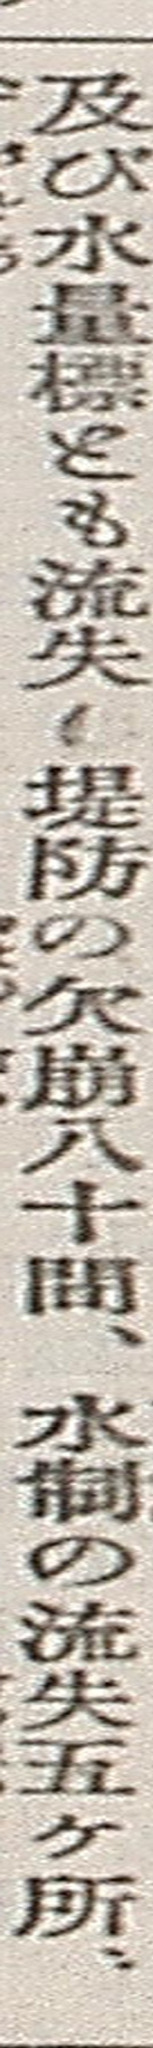及び水量標とも流失、堤防の欠崩八十間、水制の流失五ヶ所、
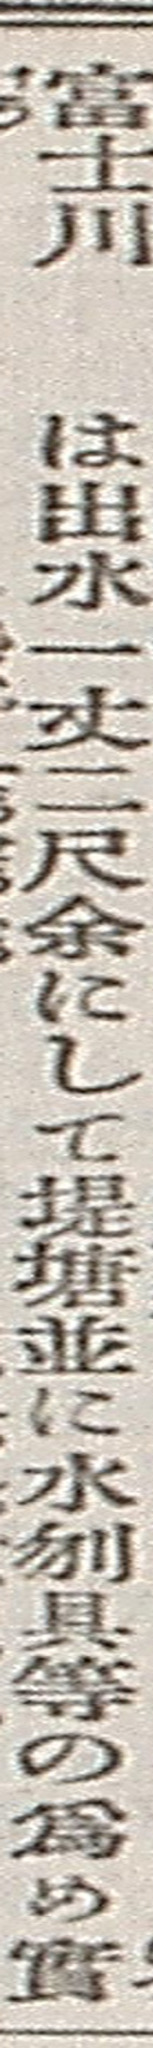富士川は出水一丈二尺余にして堤塘並に水刎具等の為め実
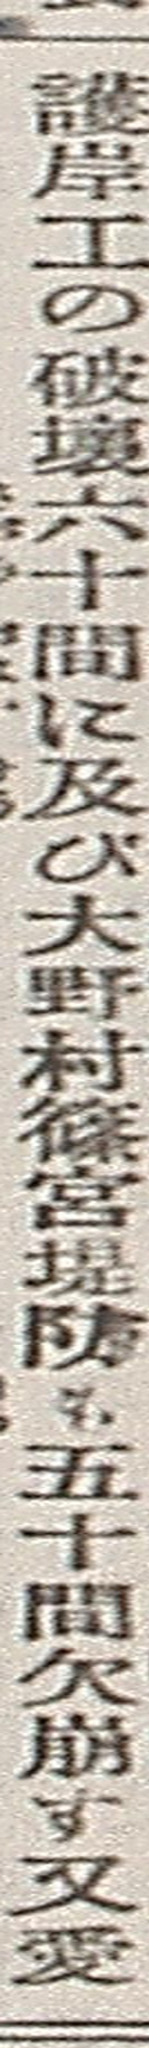護岸工の破壊六十間に及び大野村篠宮堤防も五十間欠崩す又愛
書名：風俗畫報臨時増刊第百二十八號　洪水被害録（下）
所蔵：東京大学地震研究所図書室 Earthquake Research Institute Library, The University of Tokyo, JAPAN
